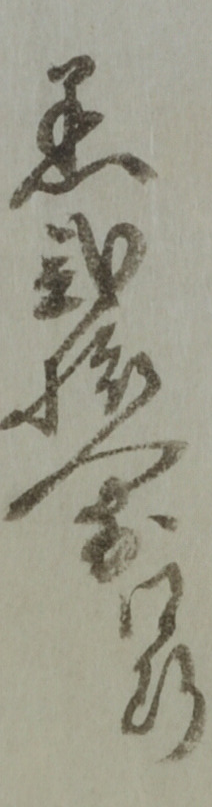黒弐拾人前弐箱
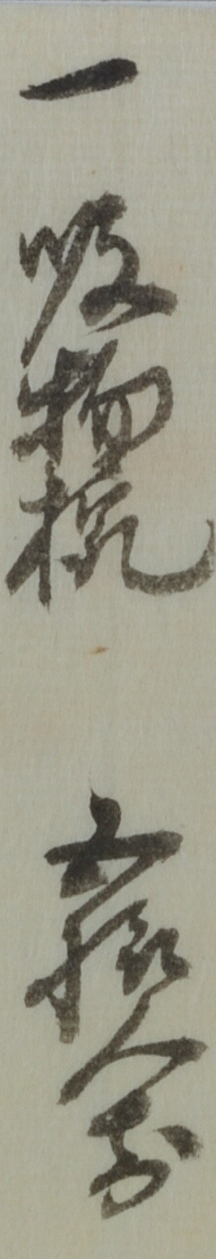一吸物椀五拾人前
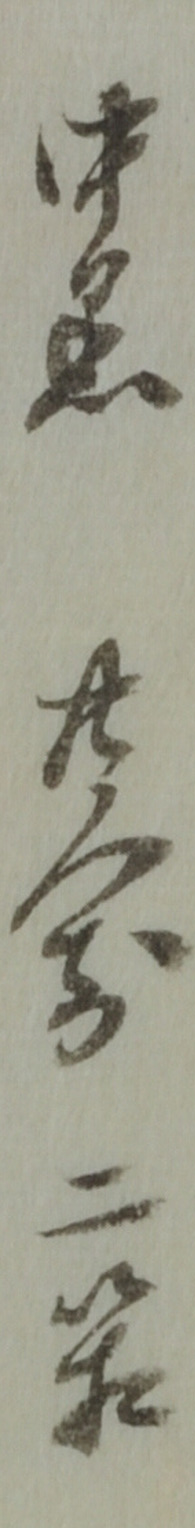中黒廿人前二箱
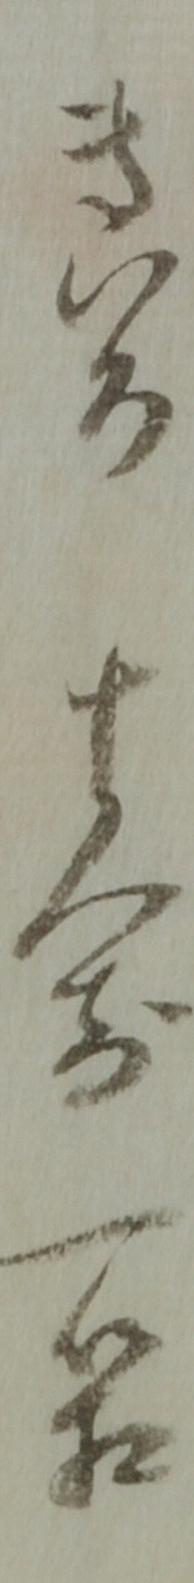きいろ十人前一箱
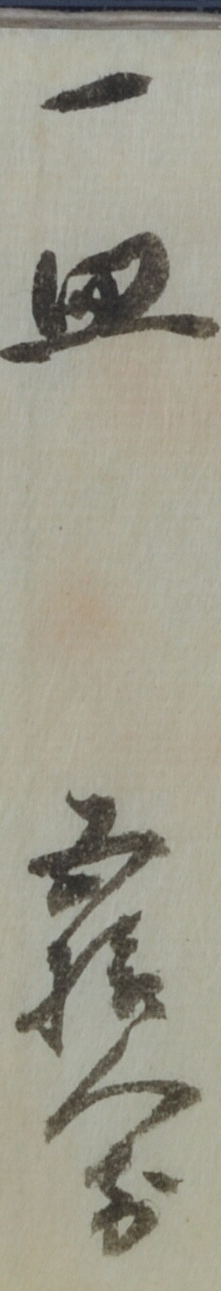一椀五拾人前
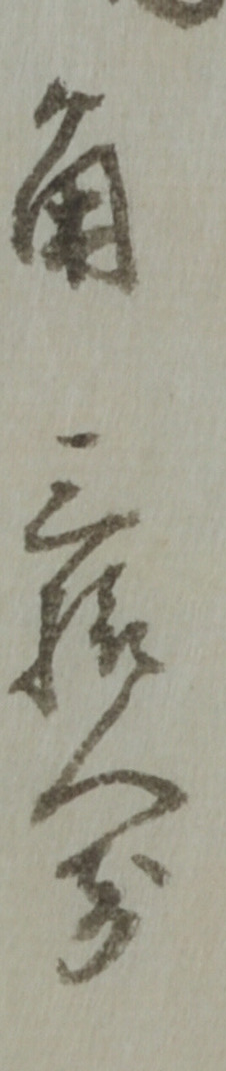角三拾人前

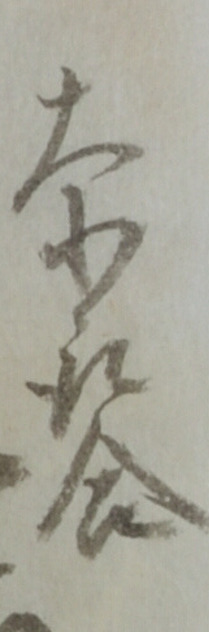大小取合
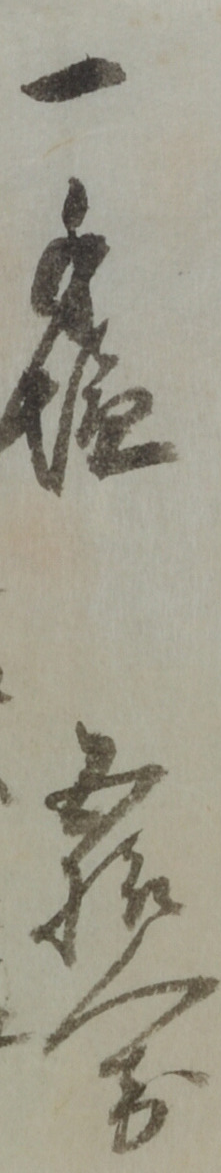一手塩五拾人前
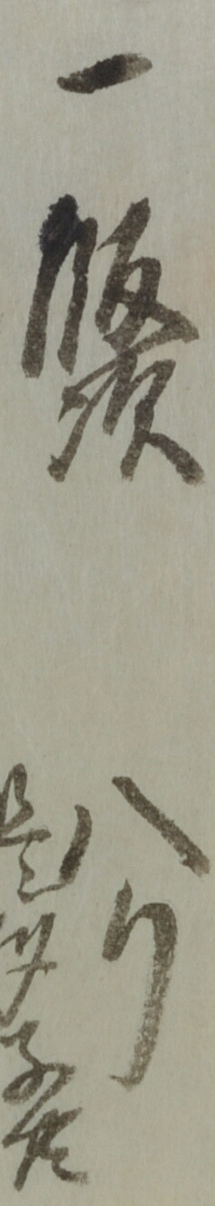一飯次八ツ
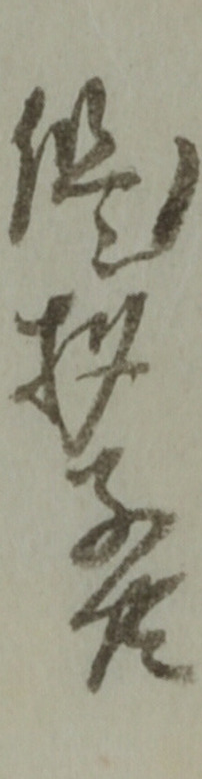但シ杓子共
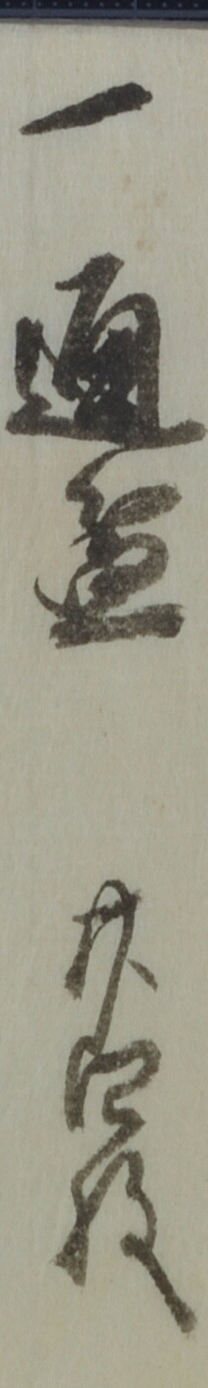一通盆廿四枚
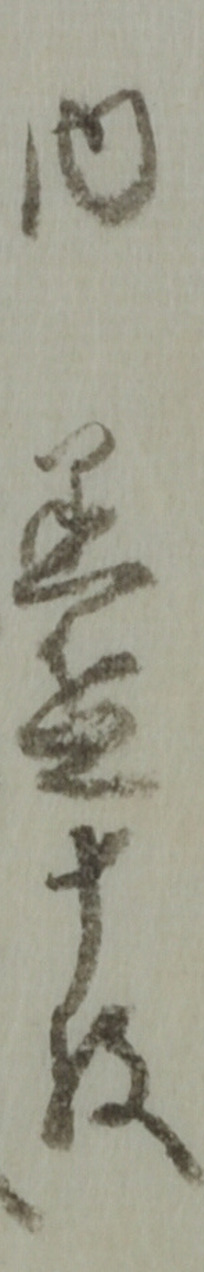内黒盆十枚
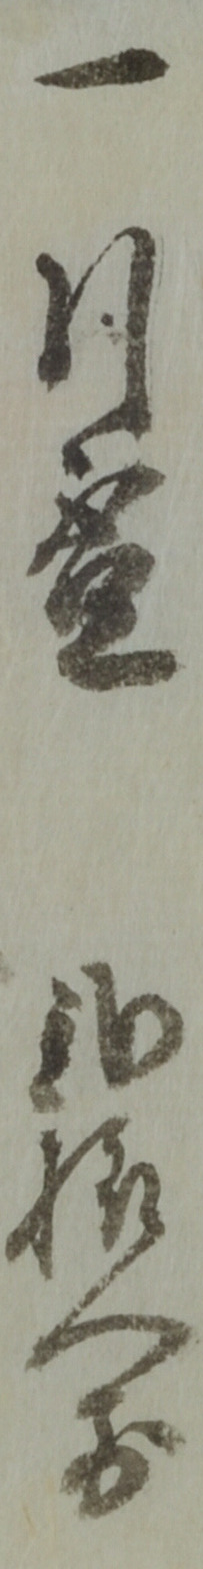一同盆弐拾人前
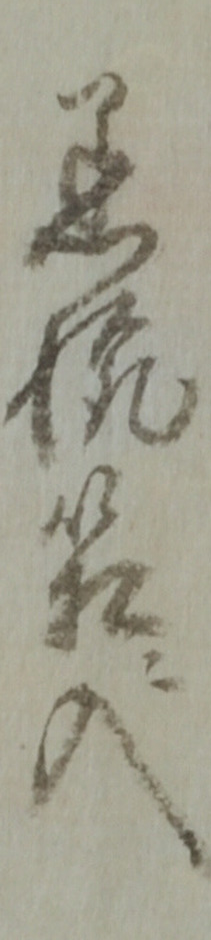黒椀箱ニ入
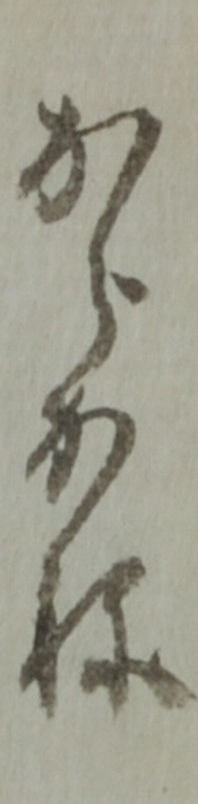からかね

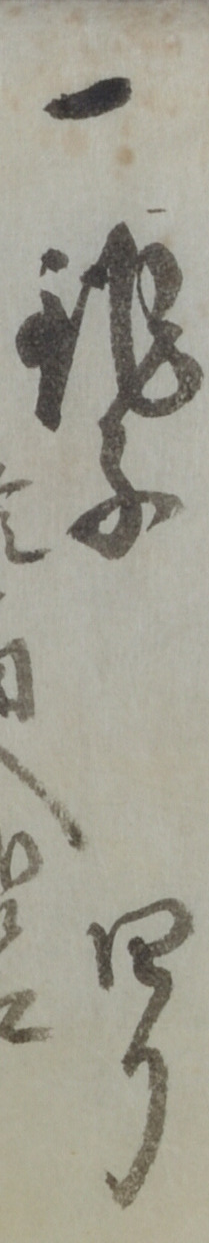一銚子四ツ
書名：遊行上人様御宿寺惣世話控
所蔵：伊那市立高遠町図書館・合同会社AMANE
